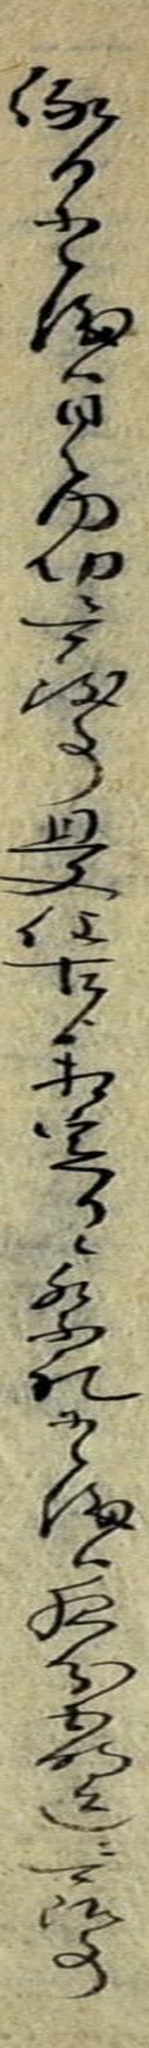縁日等之儀は日之内切に可致事且又往古ゟ相定り候祭礼等之儀は夜分五時迄に可限事
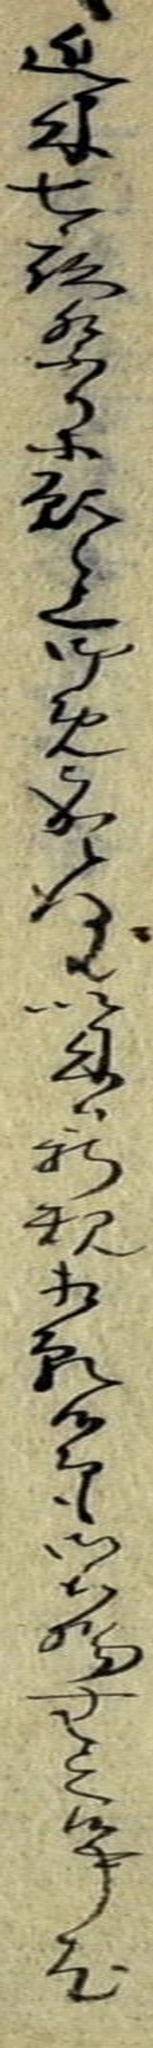一近来七夜祭り等願之上御免被成候得共以来は新規相願候而も御取揚無之候事尤
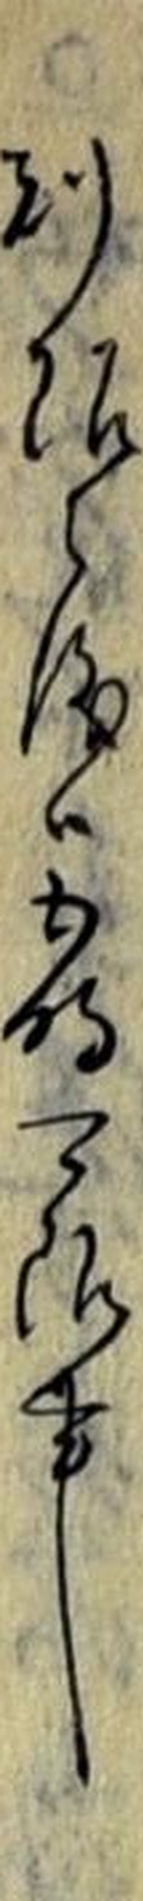刻限之儀は五時可限事
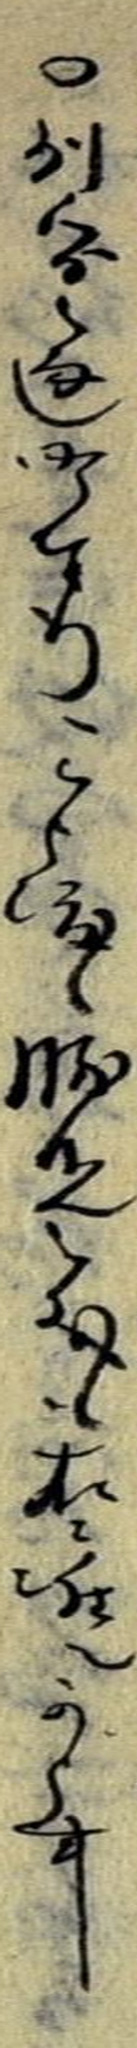○別紙之通御奉行へ被申渡候勝見之儀も右に准し可申事
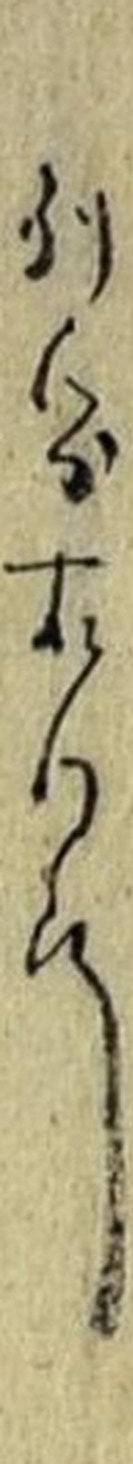別紙右同断
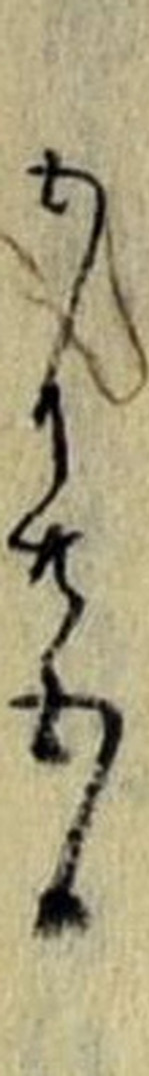五月廿五日
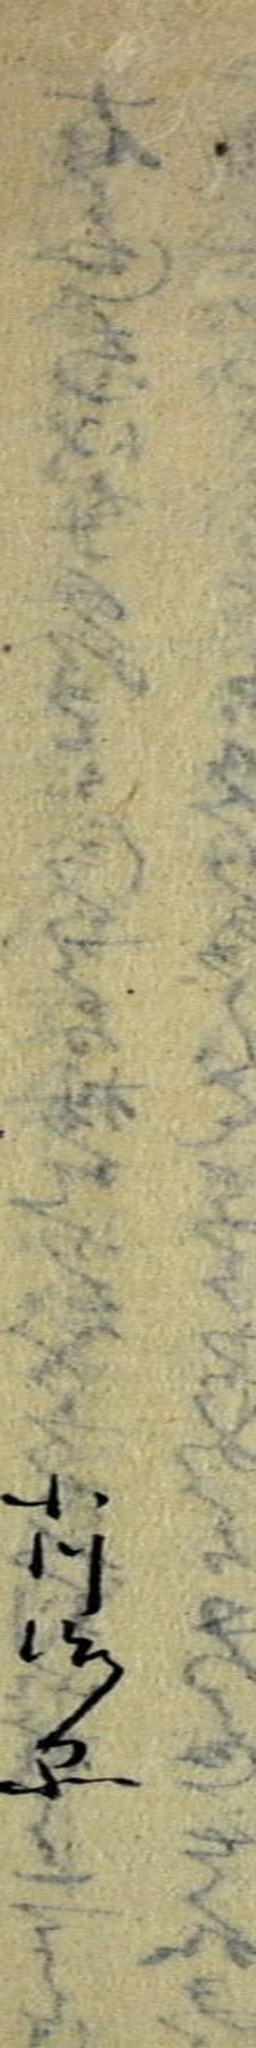小川治兵衛
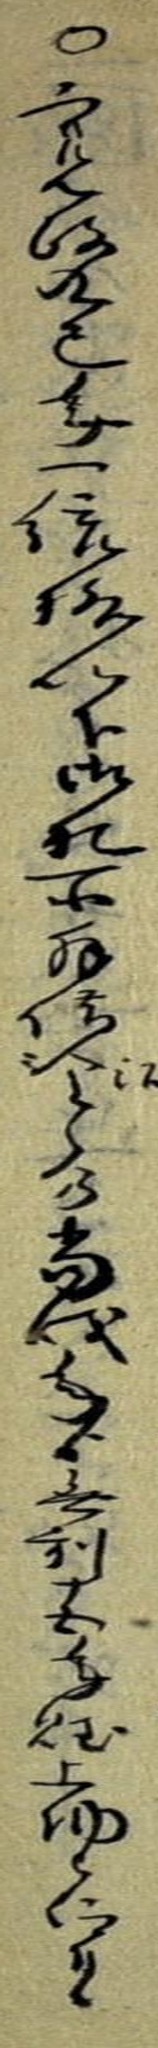○寛政九巳年一統格以可御札所拝借金之分当戌年ゟ無利十五年賦上納被仰付候
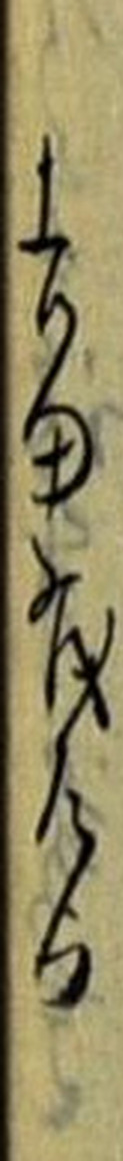吉田茂左衛門
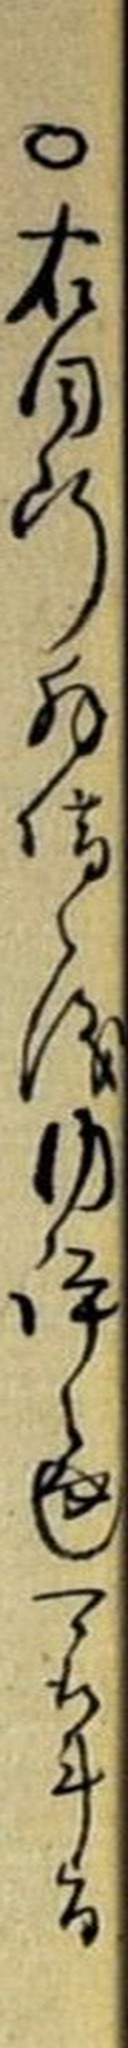○右同断拝借之儀内評之通可取斗旨
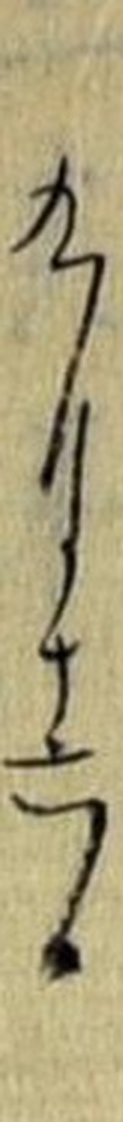九月十六日
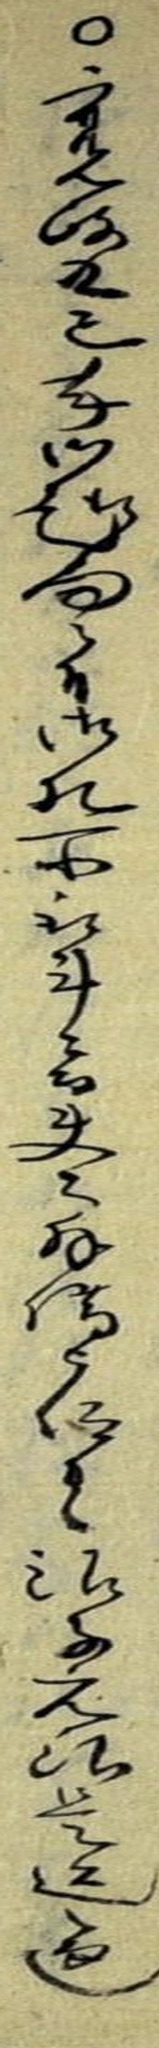○寛政九巳年御趣向に付御札所取斗に而夫々拝借被仰付候銀子元銀是迄之通
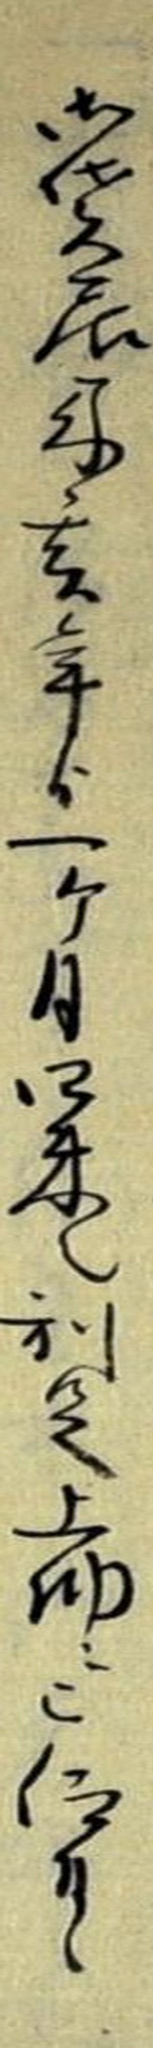御貸居来亥年ゟ一ヶ月四朱之利足上納被仰付候
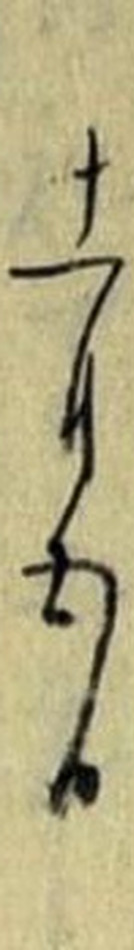十一月五日
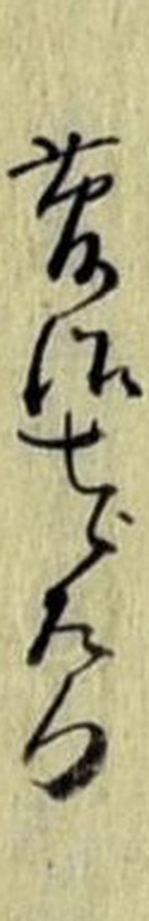菅沼七郎左衛門
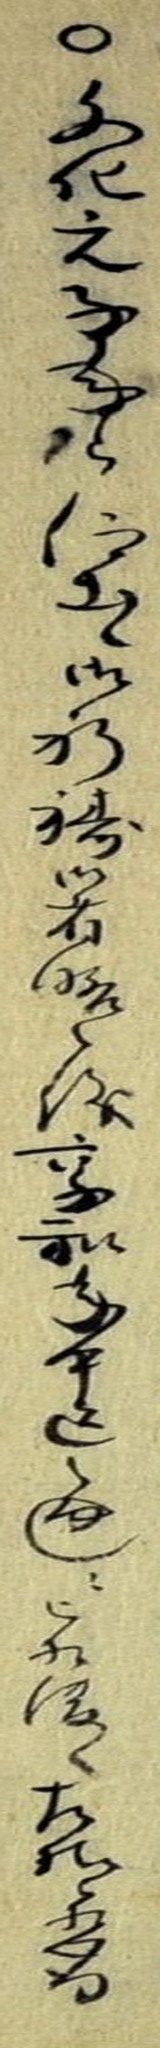○文化元子年被仰出候御祈祷御省略之儀享和年中迄之通に被相復候左様相心得
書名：命令之部 四
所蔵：福井県文書館 Fukui Prefectural Archives
